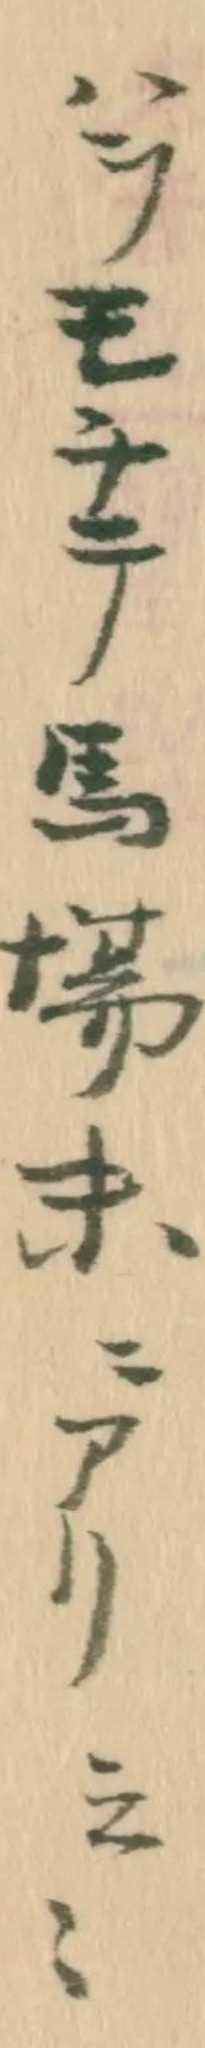ハヲモチテ馬場末ニアリ云々
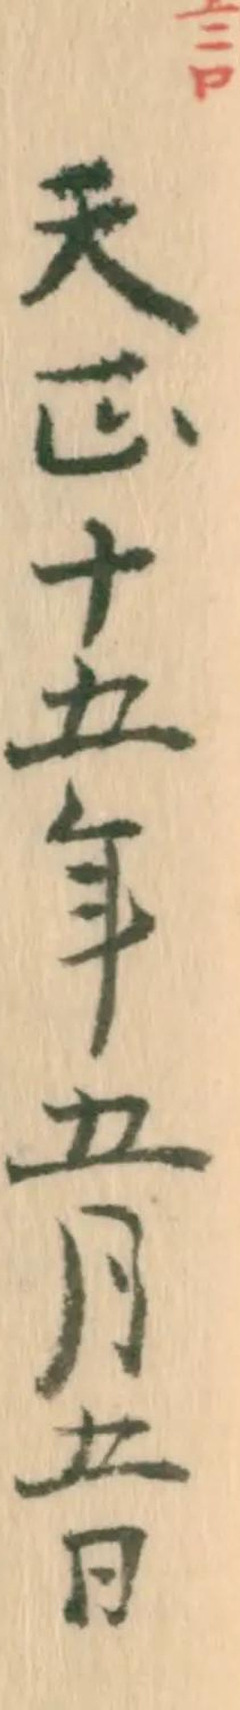一天正十五年五月五日
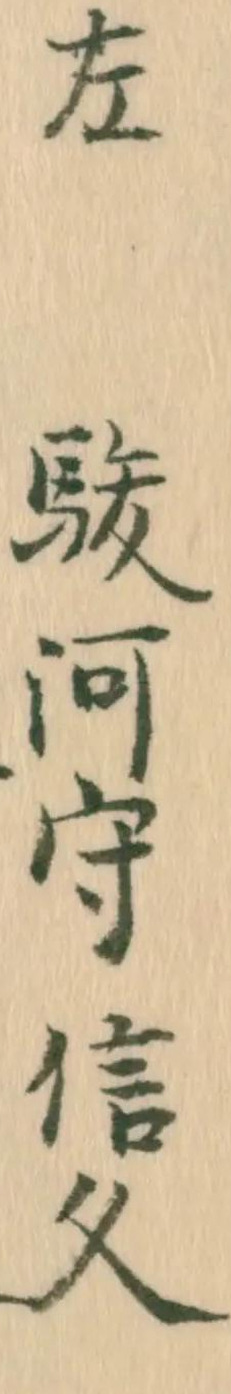左駿河守信久
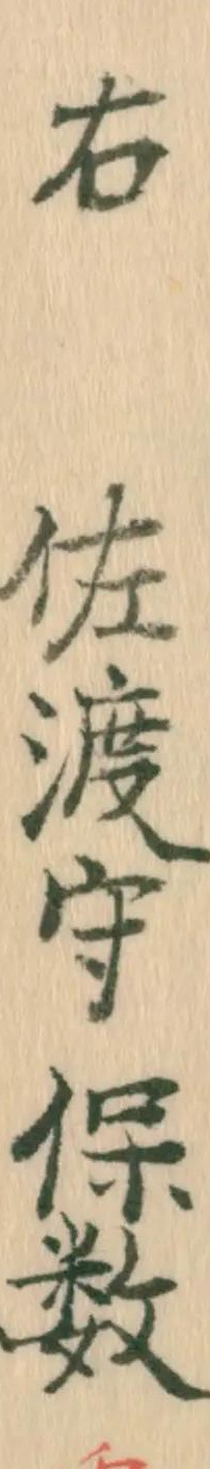右佐渡守保数
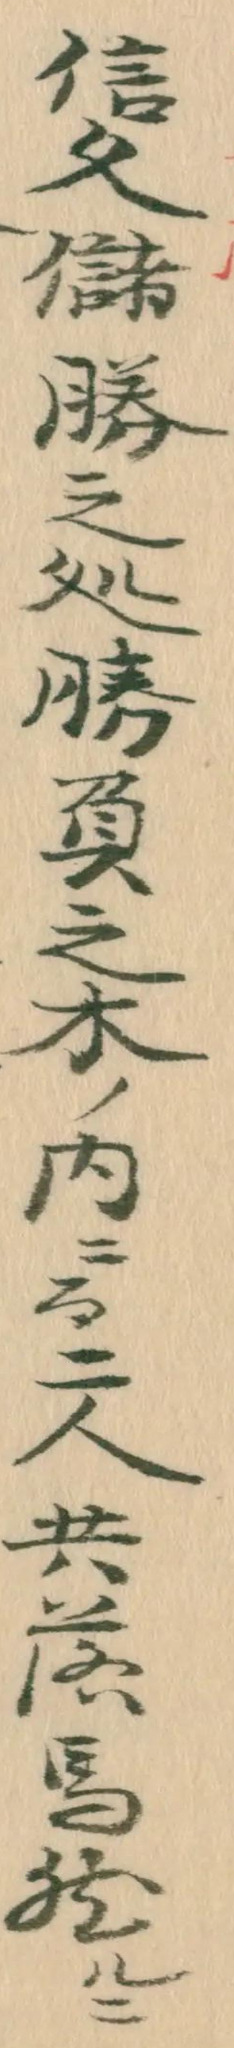信久儲勝之処勝負之木ノ内ニ而二人共落馬然ルニ
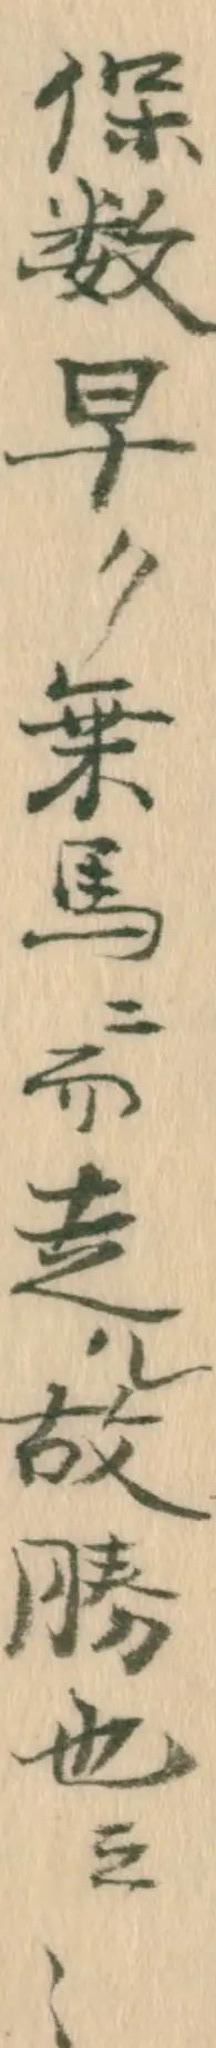保数早ク乗馬ニ而走ル故勝也云々
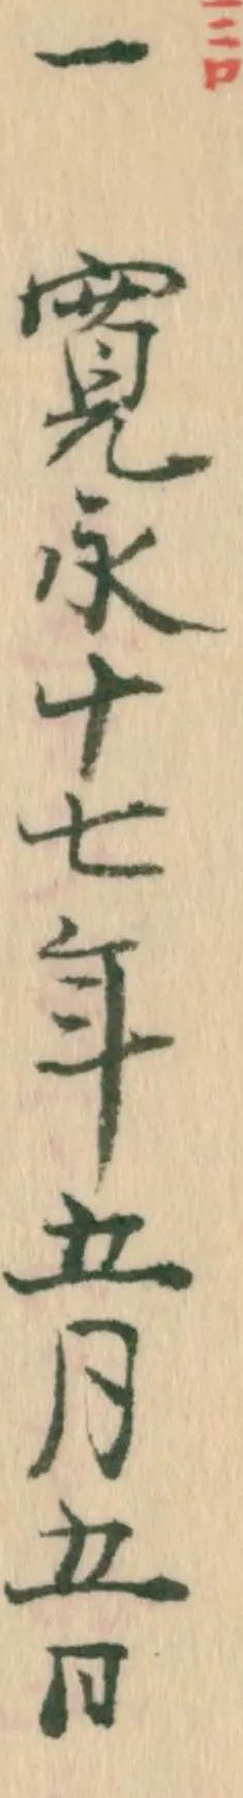一寛永十七年五月五日
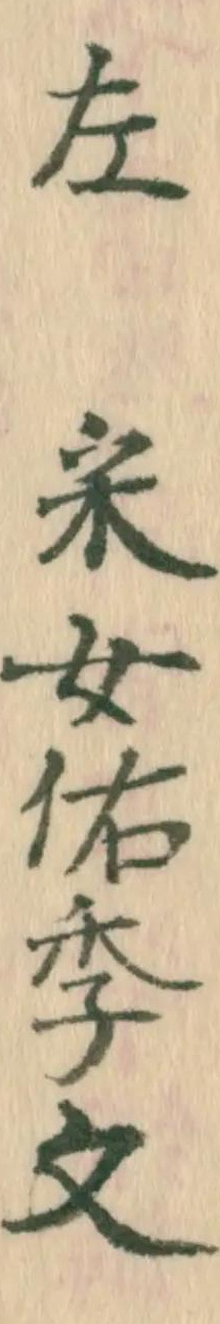左采女佑季文
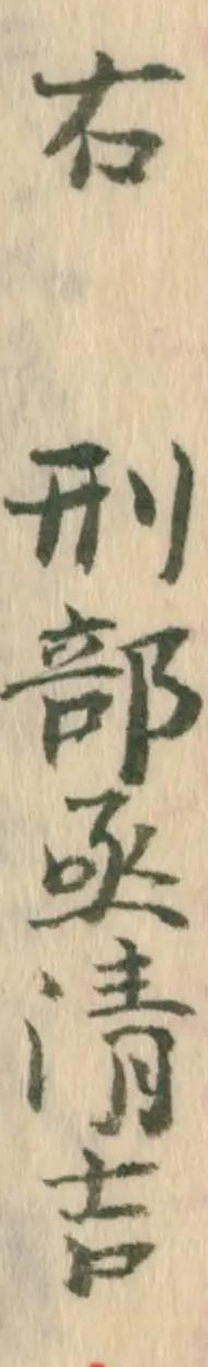右刑部丞清吉
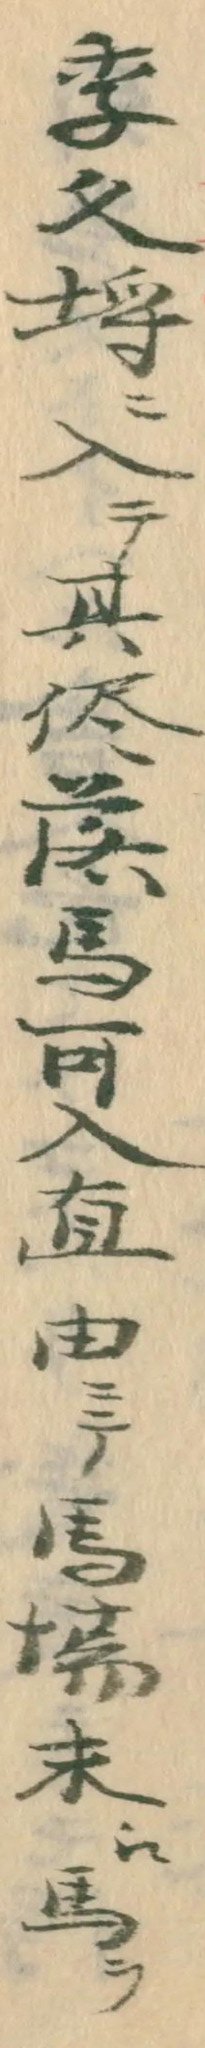季久埒ニ入テ其侭落馬可入直由ニテ馬場末江馬ヲ

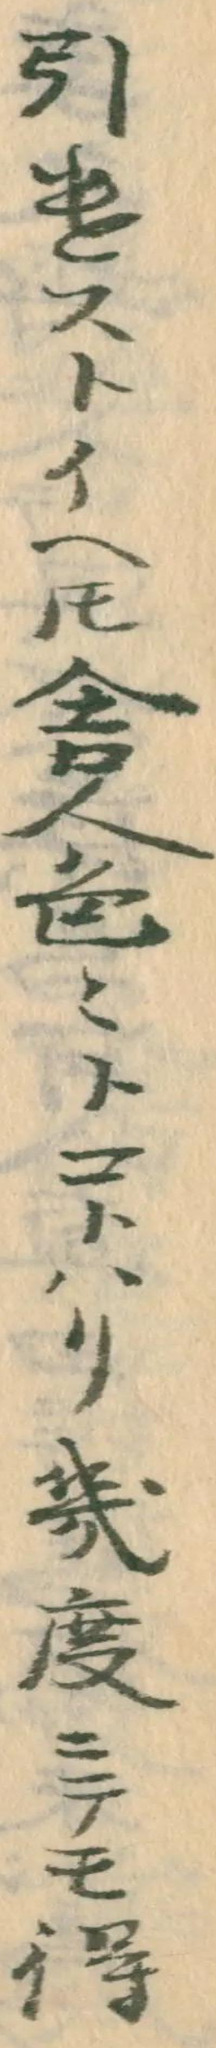引遣ストイヘトモ舎人色々トコトハリ幾度ニテモ得
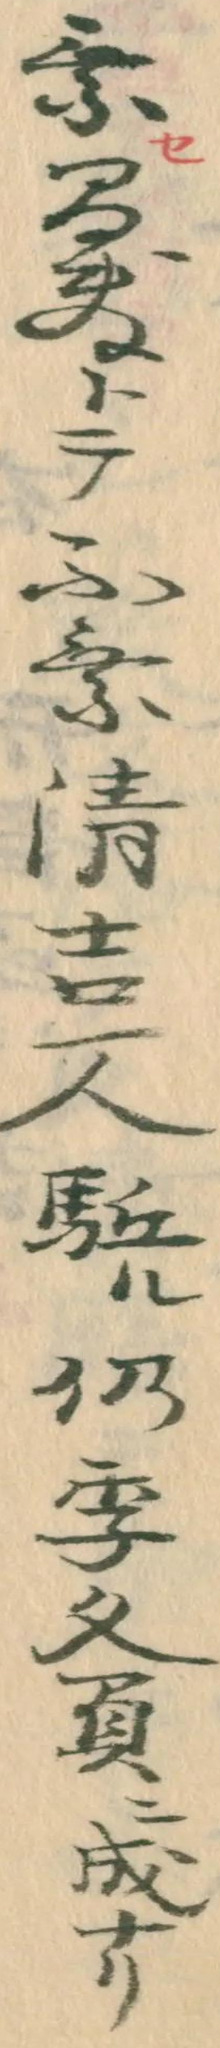乗間敷トテ不乗清吉一人駈ル仍季久負ニ成ナリ

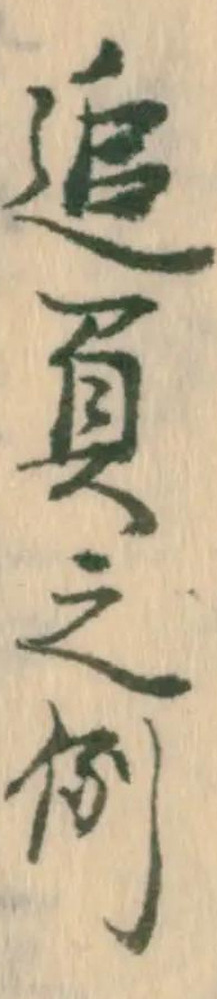追負之例
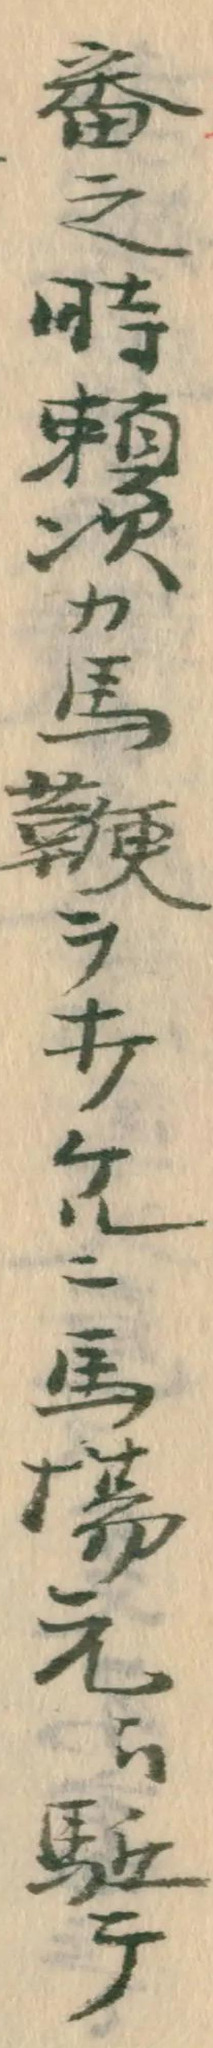番之時頼次カ馬鞭ヲ打ケルニ馬場元江駈テ
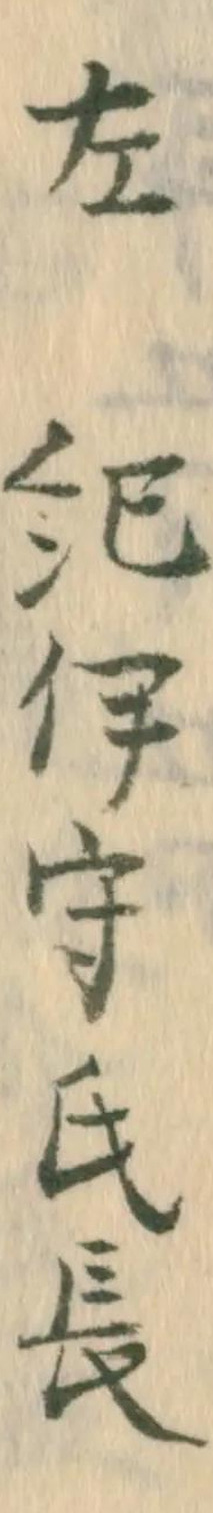左紀伊守氏長
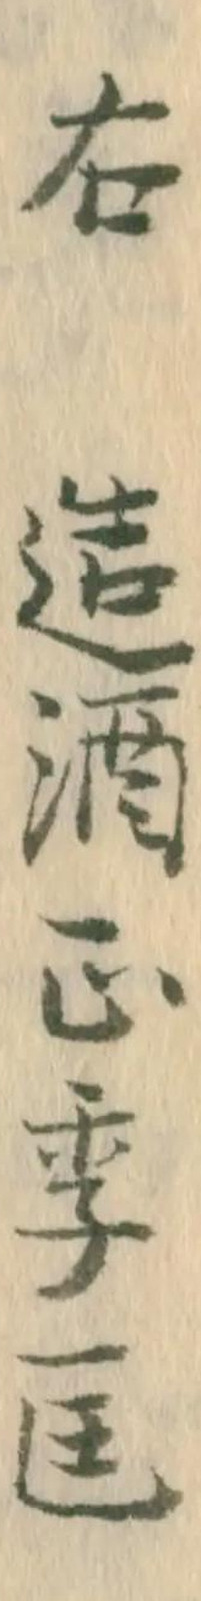右造酒正季匡
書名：賀茂社記録. 第12冊
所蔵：国立国会図書館 National Diet Library, JAPAN
